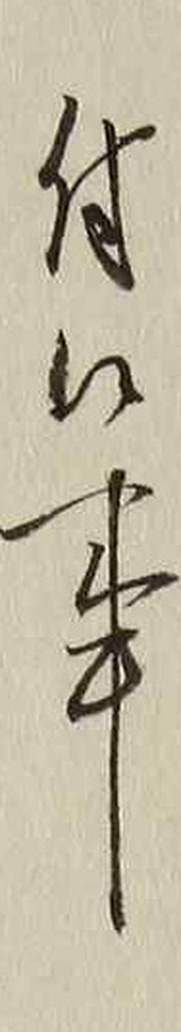付候事
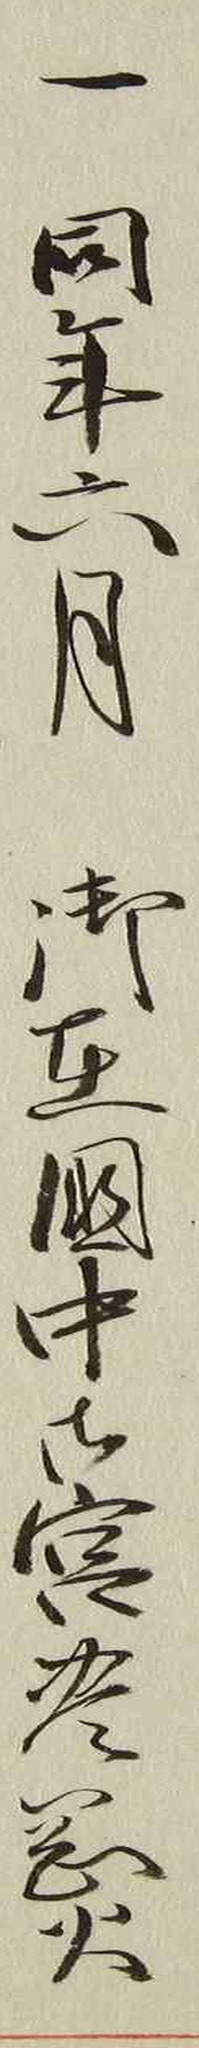一同年六月御在国中御宮尽岡火
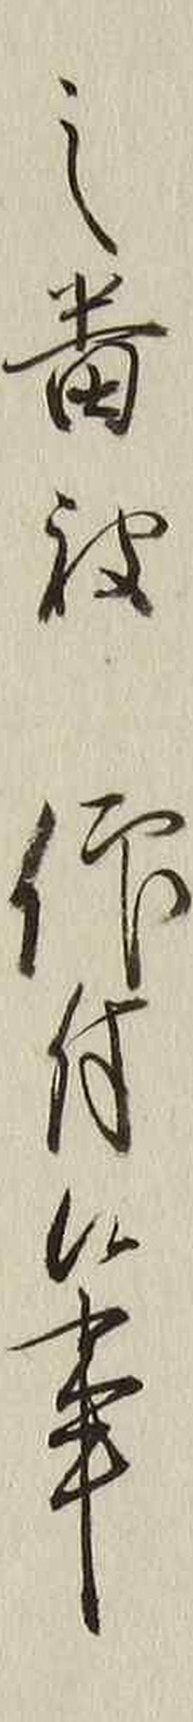之番被仰付候事
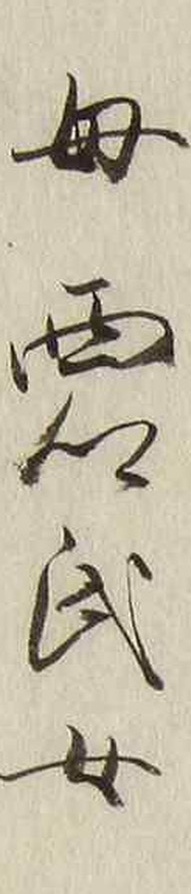母西郷氏女

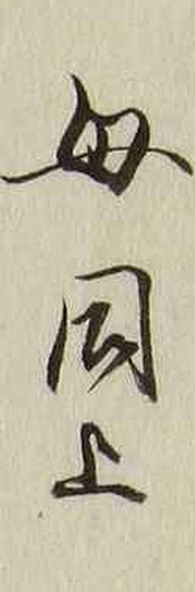母同上
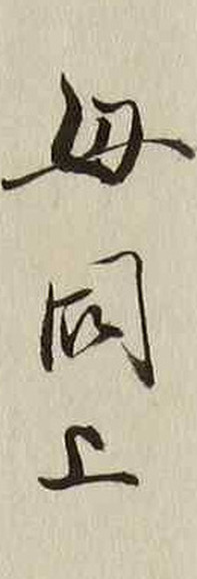母同上

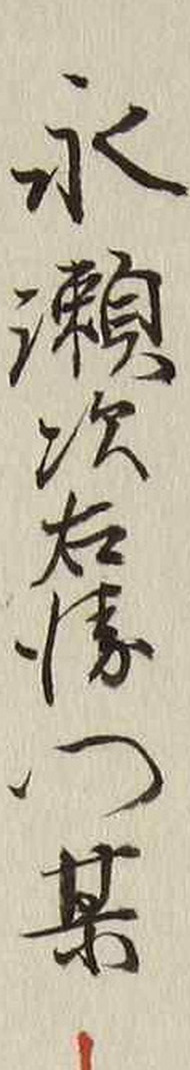永瀬次右衛門某
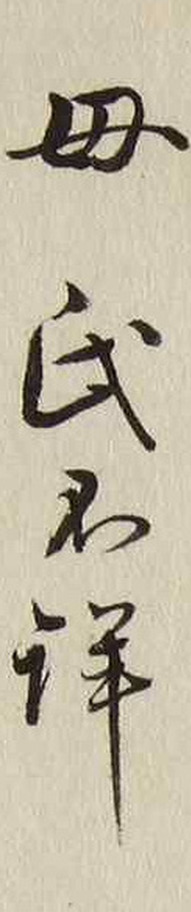母氏不詳
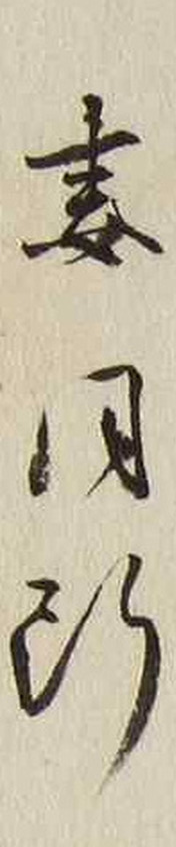妻同断

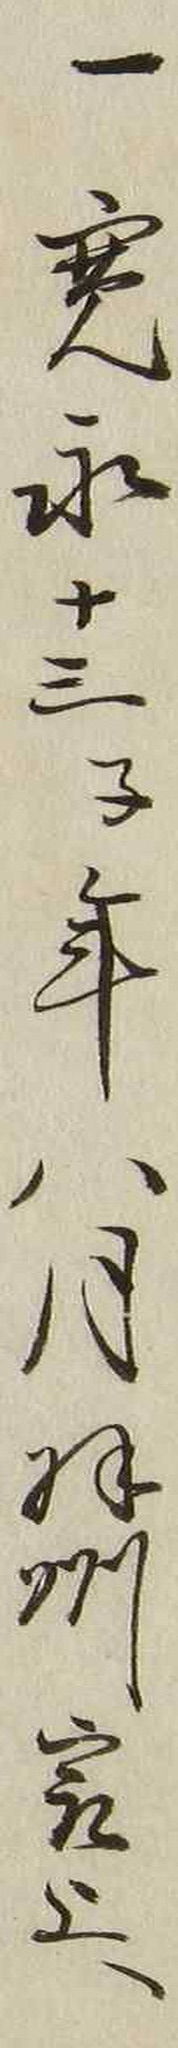一寛永十三子年八月羽州最上ㇸ
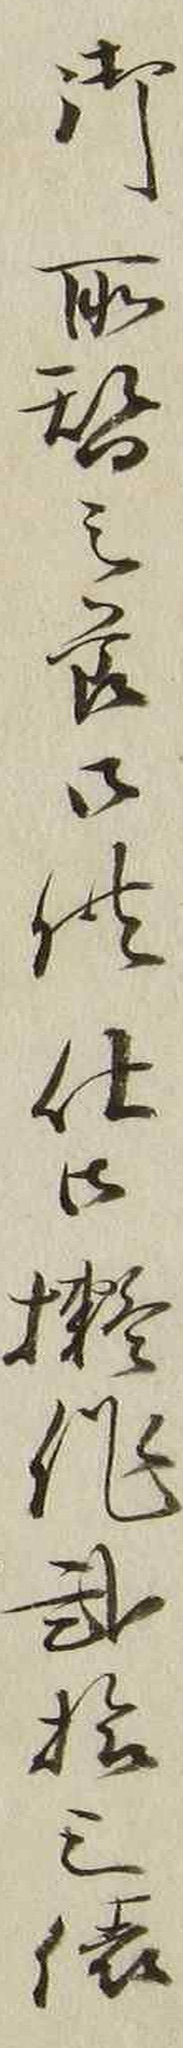御所替之節御供仕御擬作弐拾三俵
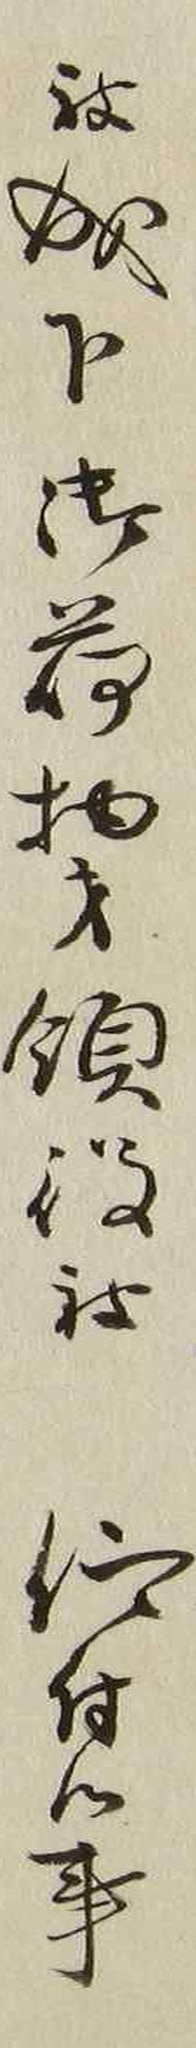被成下御荷物才領役被仰付候事
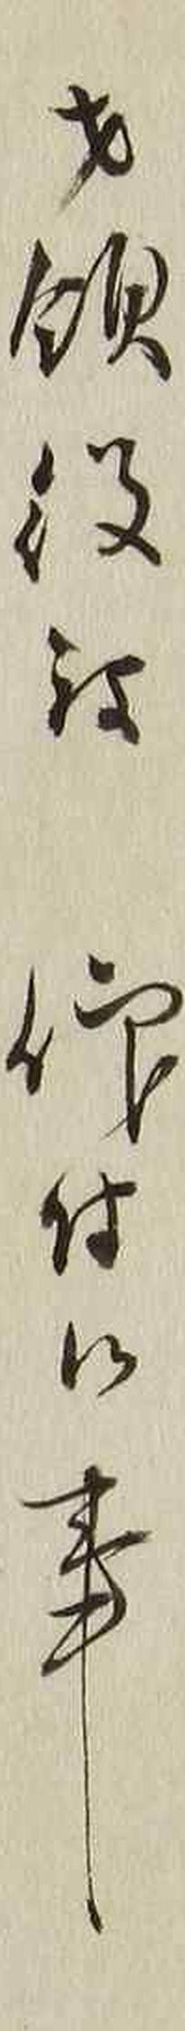才領役被仰付候事
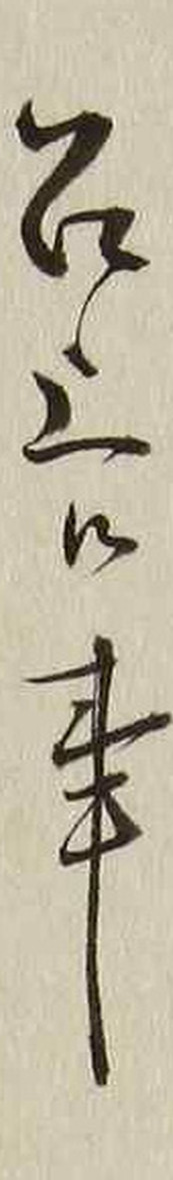召上候事
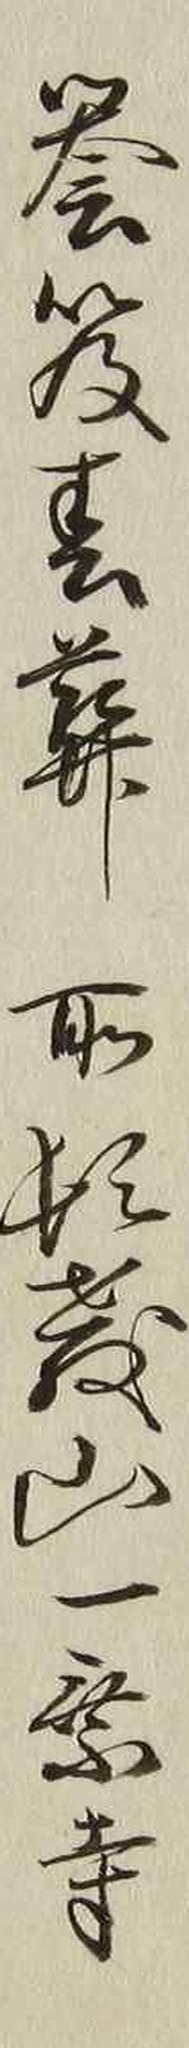誉笈春葬所頓教山一乗寺
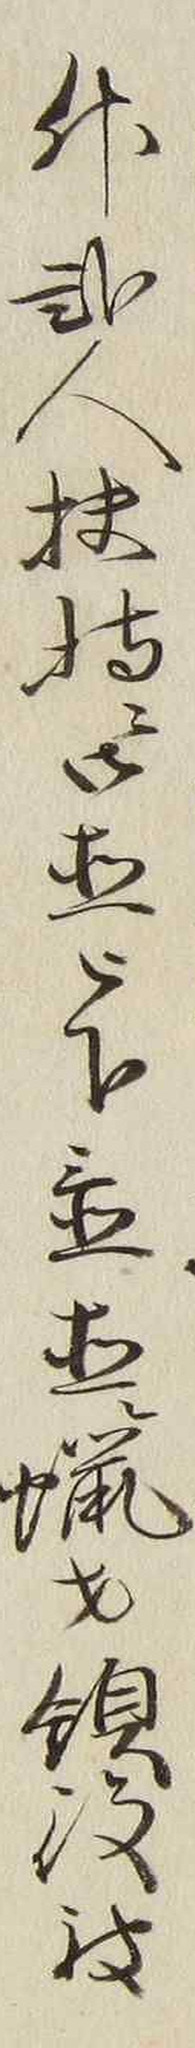升弐人扶持ニ御直被下置直ニ蠟才領役被
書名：諸士系譜　巻之163　な之部5
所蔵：会津若松市立会津図書館
